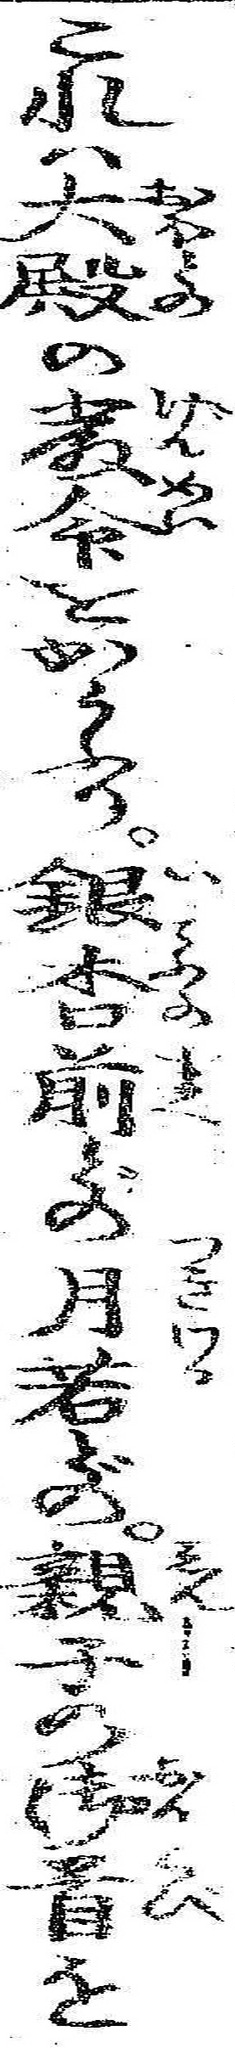これは大殿の厳命をかうふり。銀杏前どの月若どの。親子の御首を
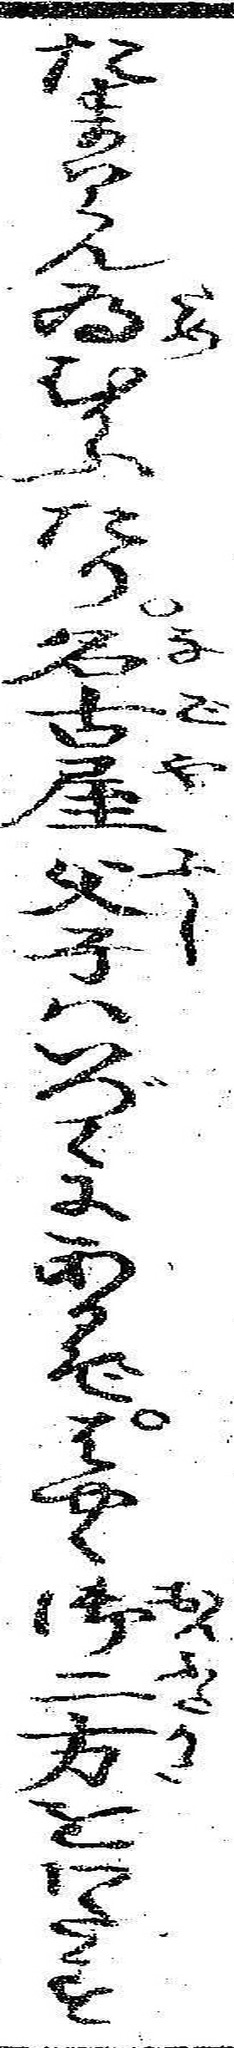たまわらん為むかふたり。名古屋父子はいづくにあるぞ。はやく御二方をわたす
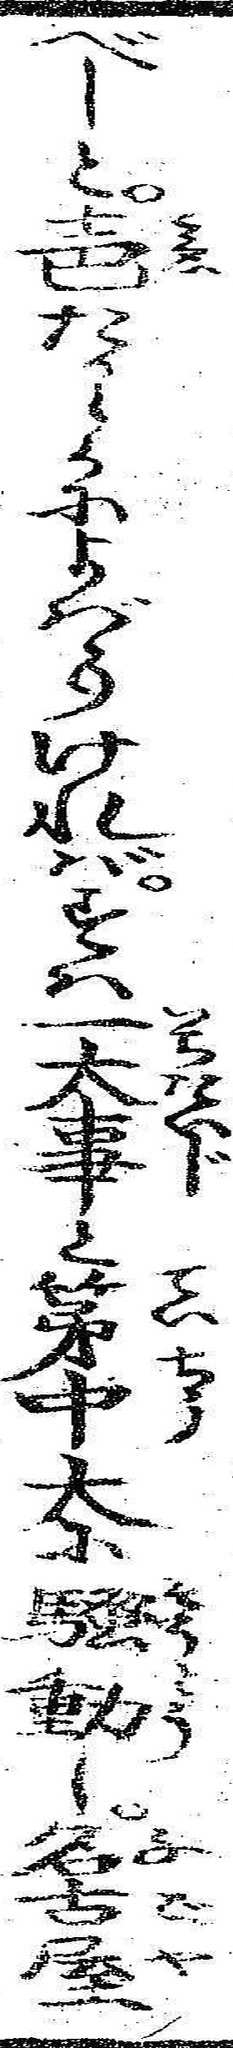べしと。声たからかによばゝりければ。すは一大事と第中大に騒動し。名古屋
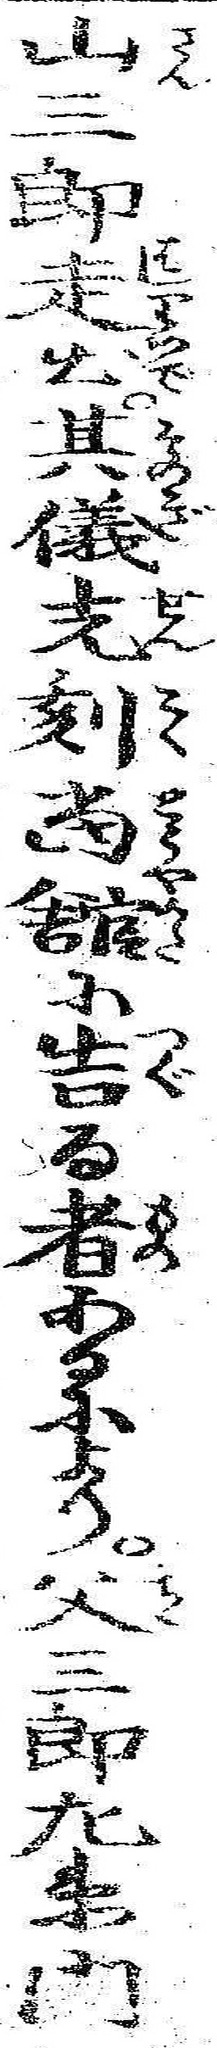山三郎走出。其儀先刻当館に告る者あるにより。父三郎左衛門
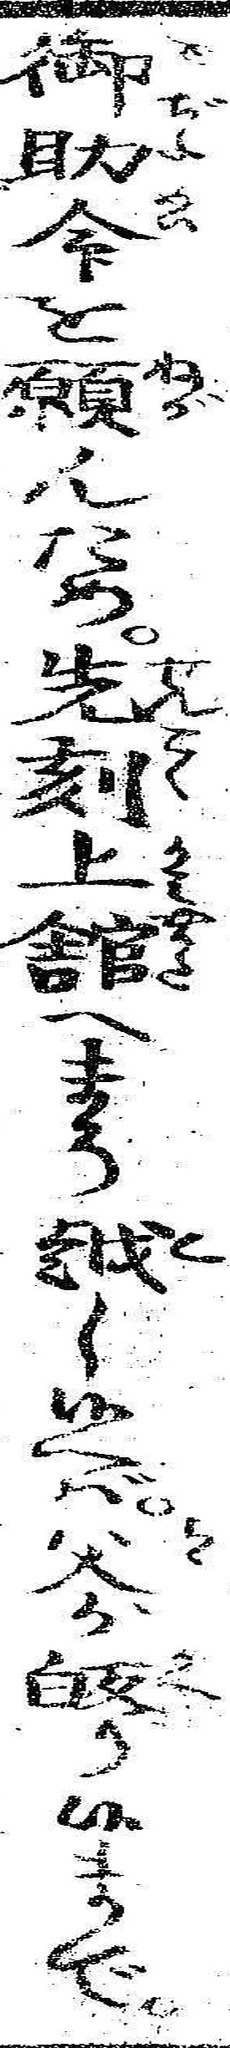御助命を願んため。先刻上館へまかり越し候へば。父が帰り候まで。
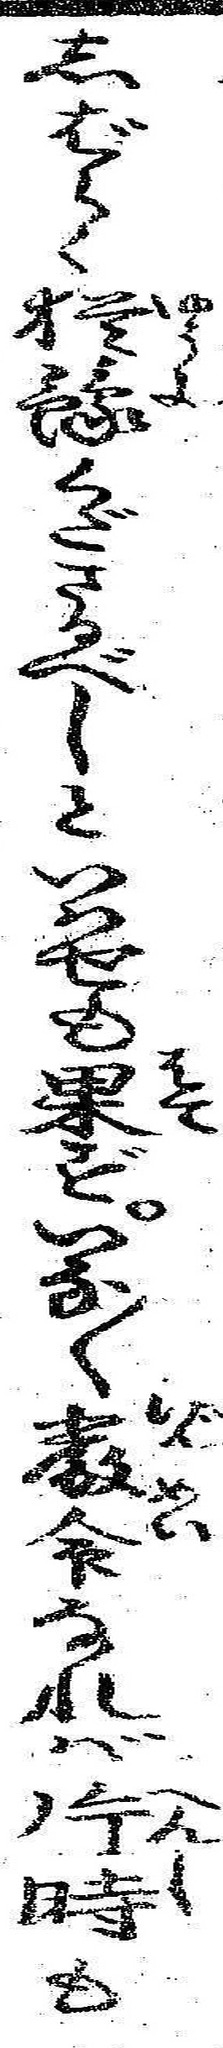しばらく猶予くださるべしといはせも果ず。いな〳〵厳命なれば片時も

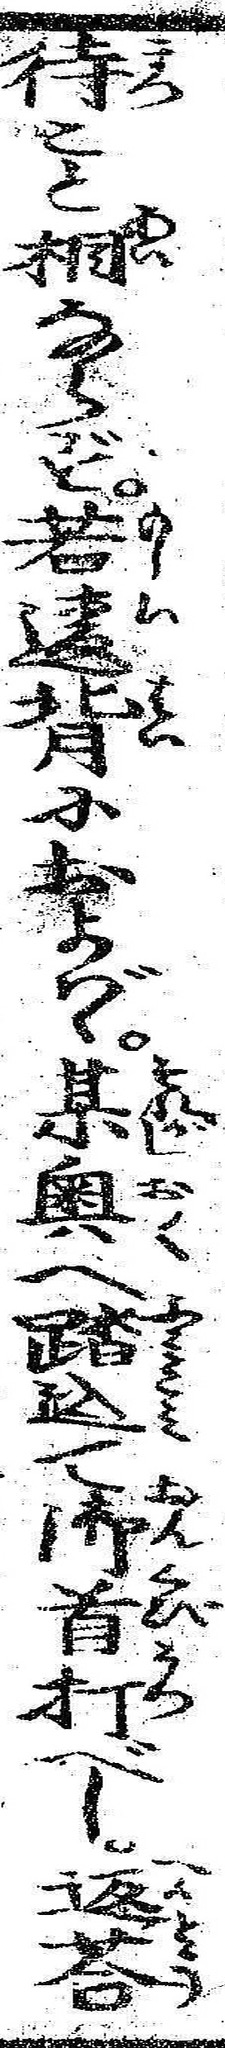待こと相ならず。若違背におよばゝ。某奥へ踏込て御首打べし。返荅
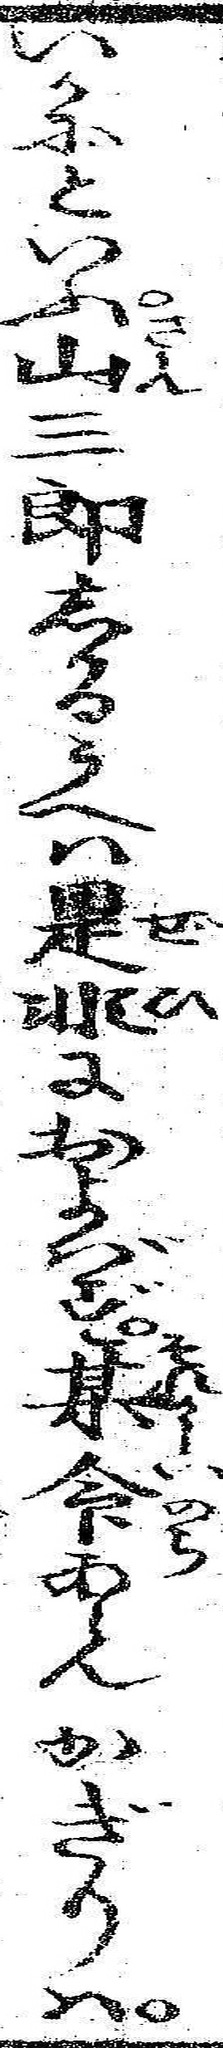いかにといふ。山三郎しかるうへは是非におよばず。某命あらんかぎりは。
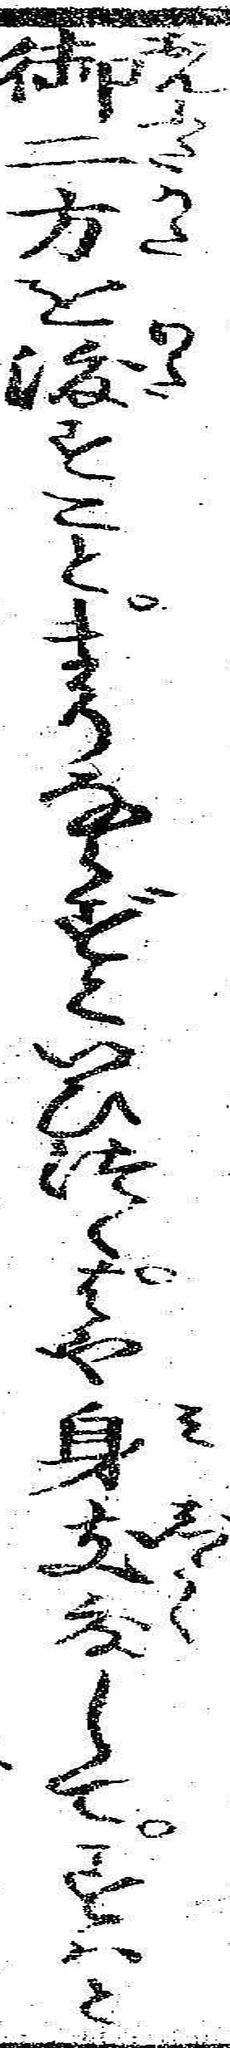御二方を渡すこと。まかりならずといひつゝ。はや身支度して。すはと
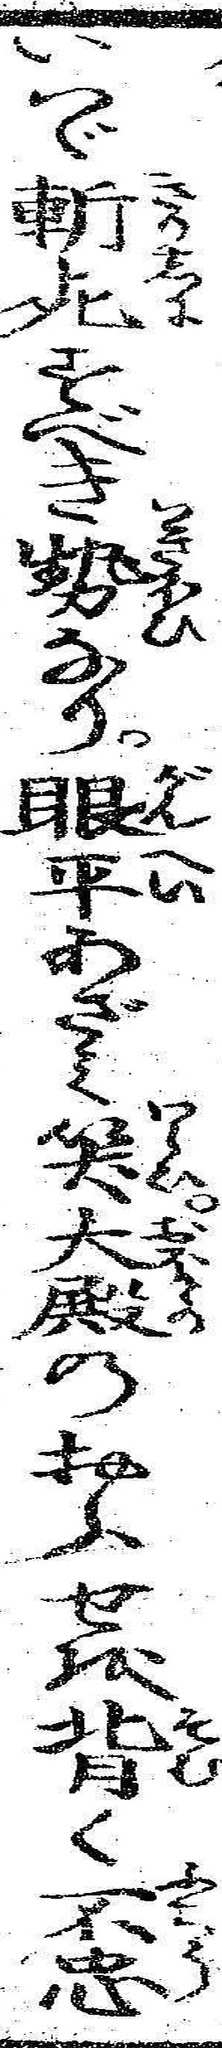いはゞ斬死すべき勢なり。眼平あざみ笑。大殿のおふせを背く不忠
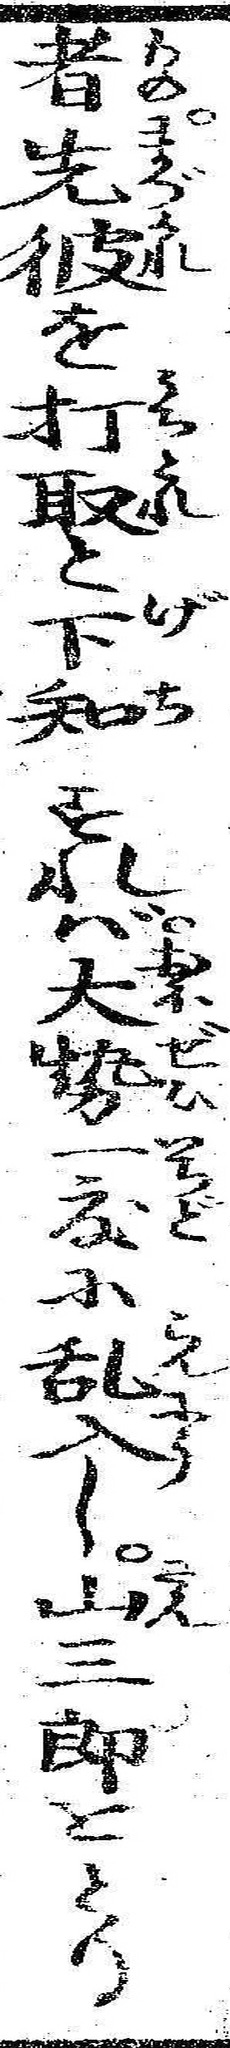者。先彼を打取と下知すれば。大勢一度に乱入し。山三郎をとり
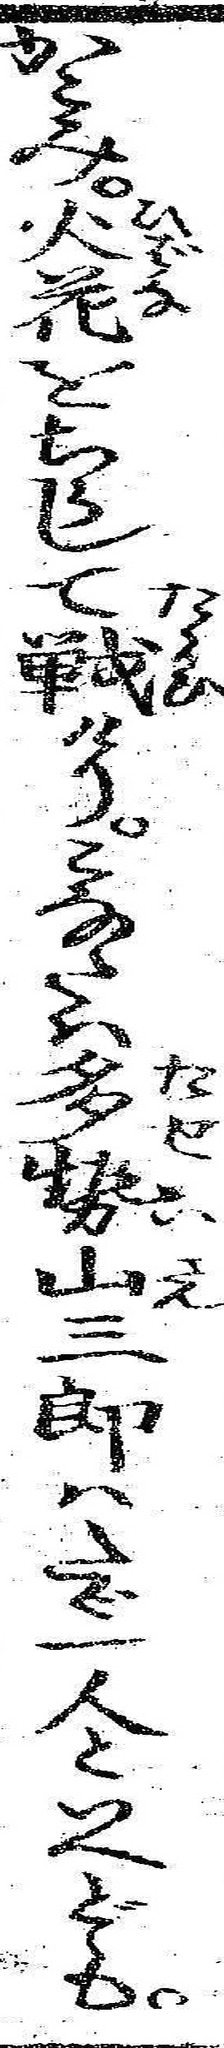かこみ。火花をちらして戦けり。こなたは多勢山三郎はたゞ一人といへども。
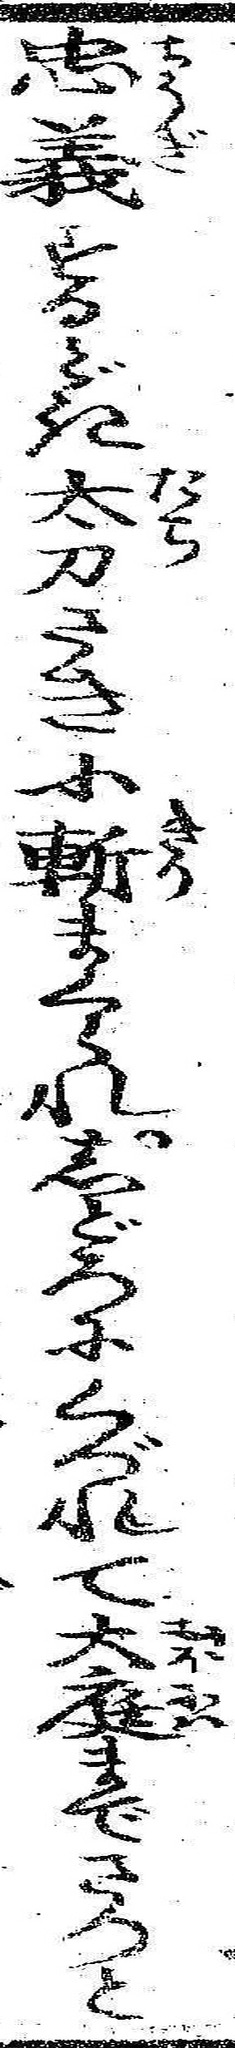忠義するどき太刀さきに斬まくられ。しどろにくづれて大庭までさつと
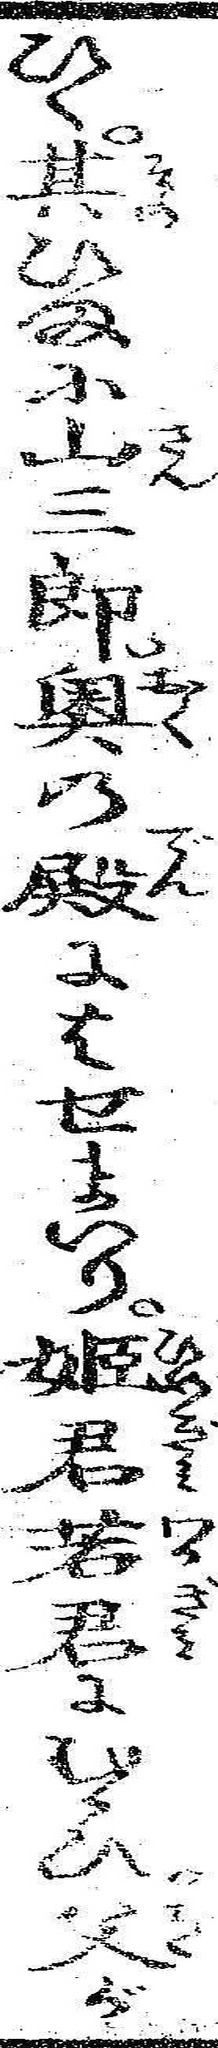ひく。其ひまに山三郎。奥の殿にはせまいり。姫君若君にむかひ。父が
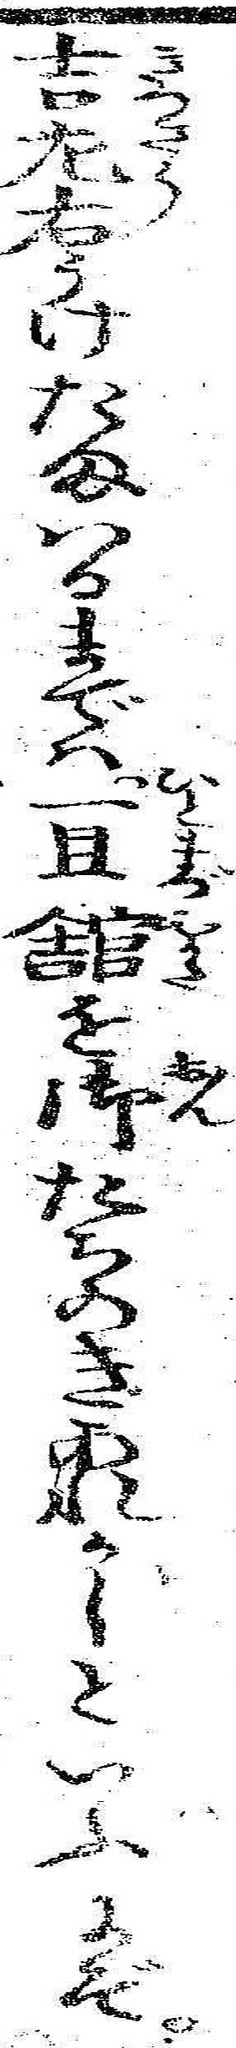吉左右うけたまはるまでは。一且館を御たちのきあれかしといふにぞ。
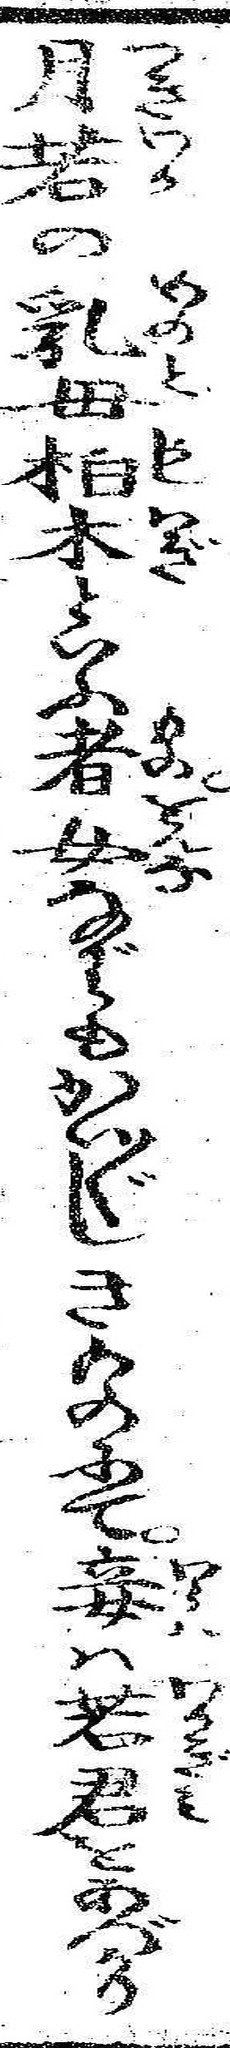月若の乳母柏木といふ者。女ながらもかい〴〵しきものにて。妾は若君をあづかり
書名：昔話稲妻表紙
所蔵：国文学研究資料館
